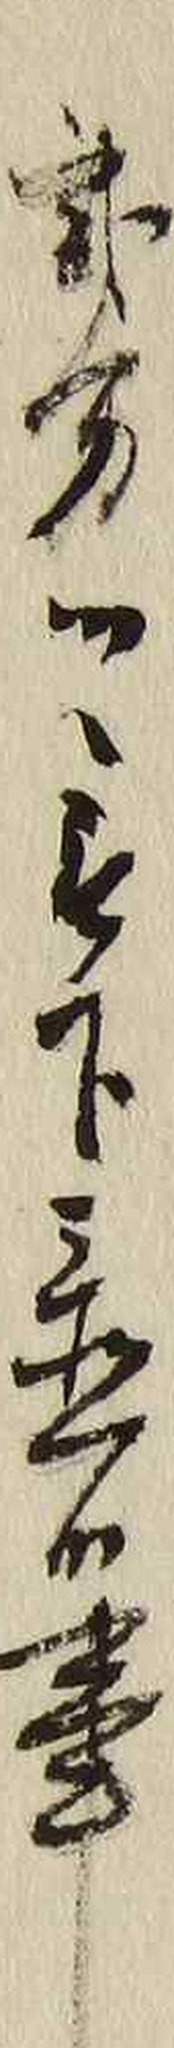弐分ツヽ被下置候事
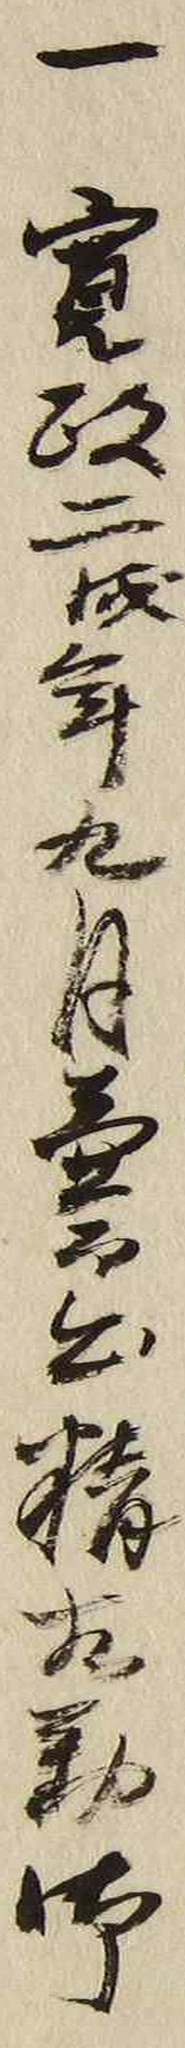一寛政二戌年九月兼而出精相勤御

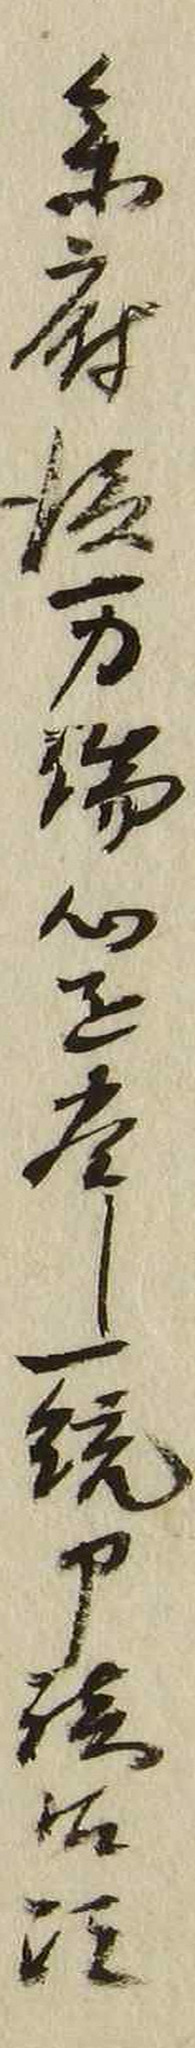参府後万端心を尽し一統申談御次
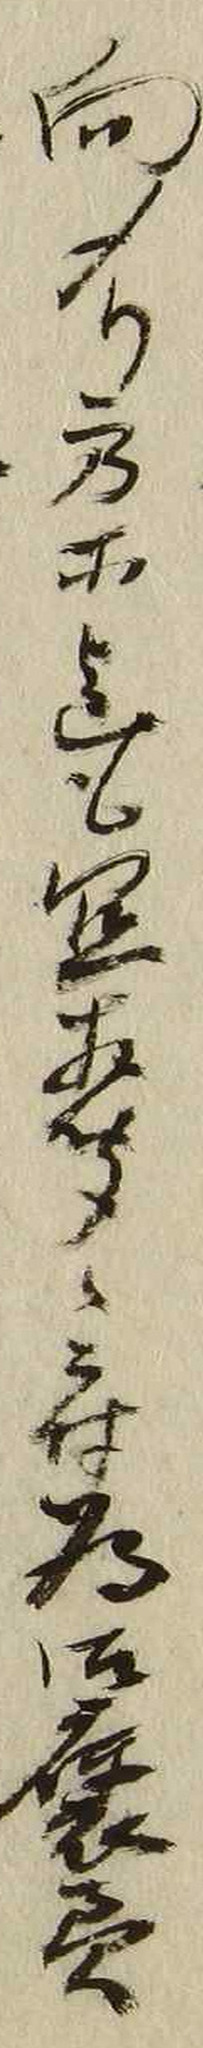向〆り方等迄も宜相聞候ニ付為御褒美
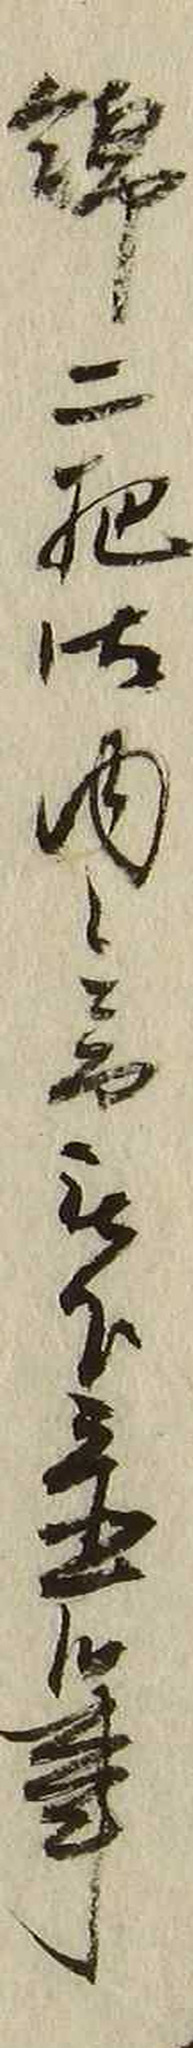綿二把御内々ニ而被下置候事
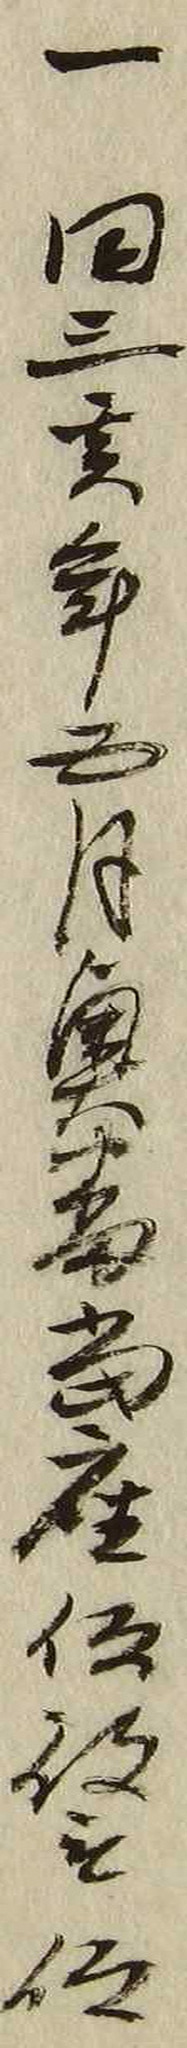一同三亥年五月奥番当座仮役被仰
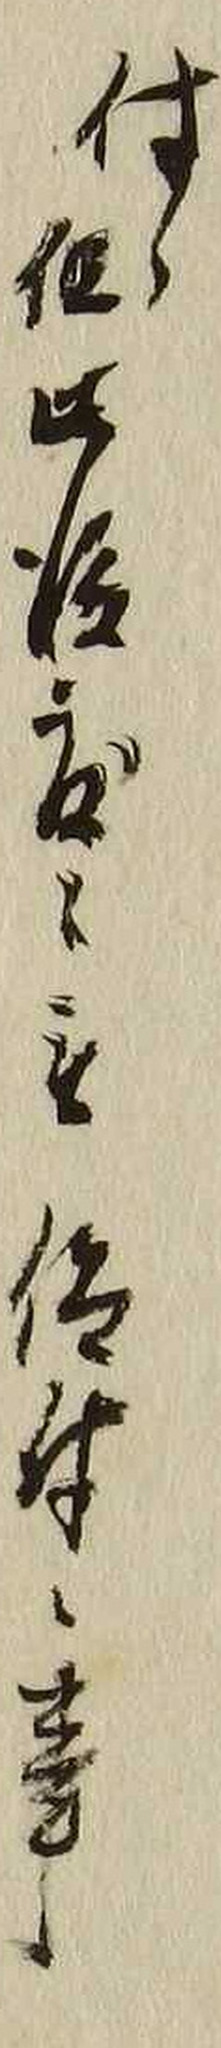但此後度々被仰付候事
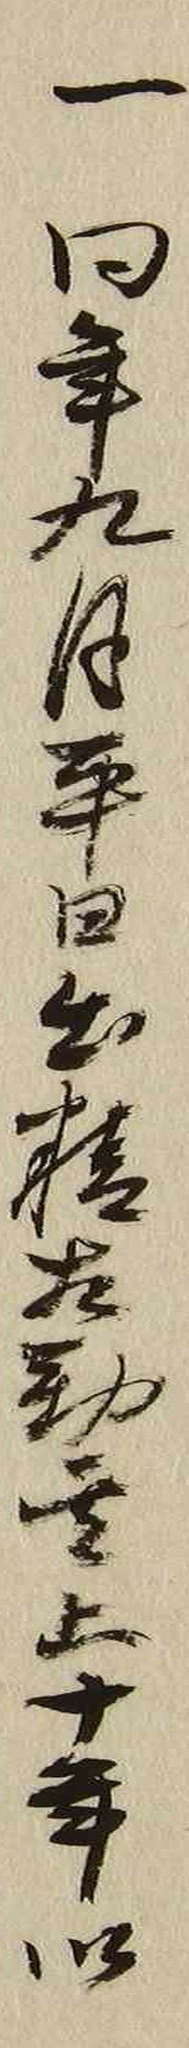一同年九月平日出精相勤其上十年以
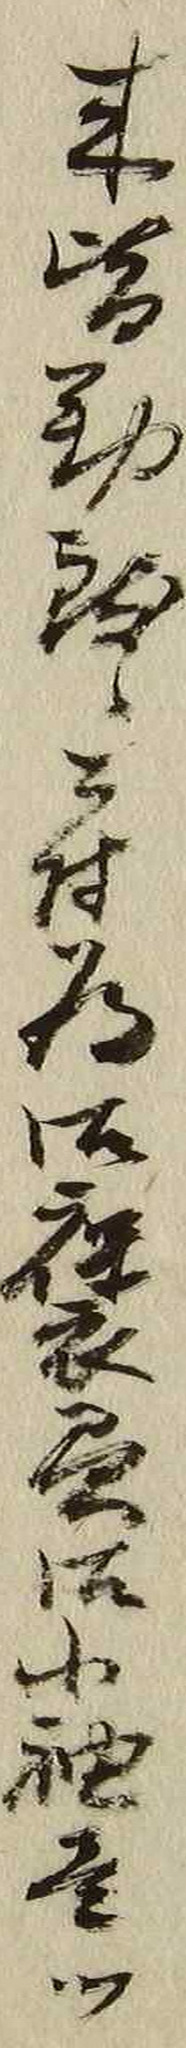来皆勤致候ニ付為御褒美御小袖壱ツ
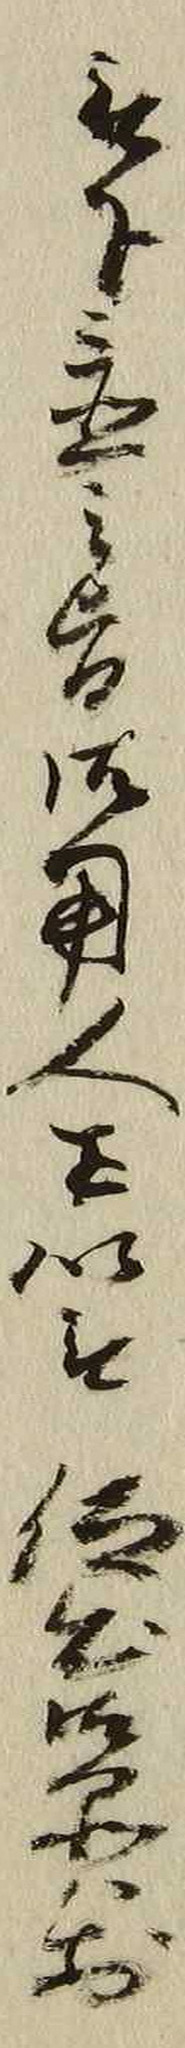被下置之旨御用人を以被仰出御品ハ於
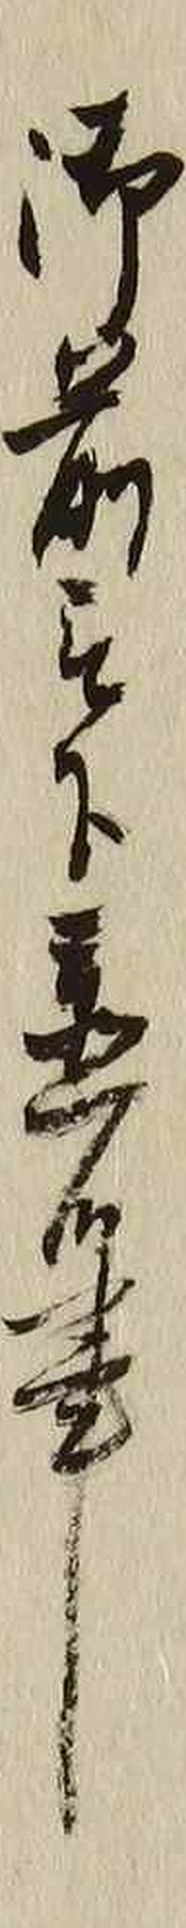御前被下置候事
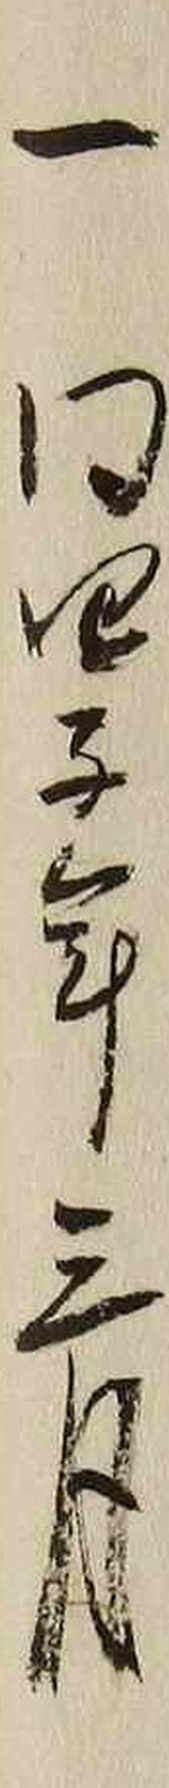一同四子年三月
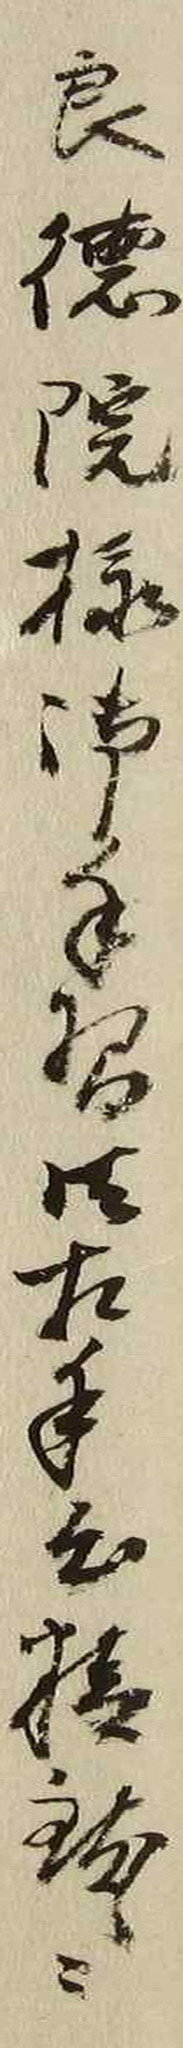良徳院様御手習御相手出精致候ニ
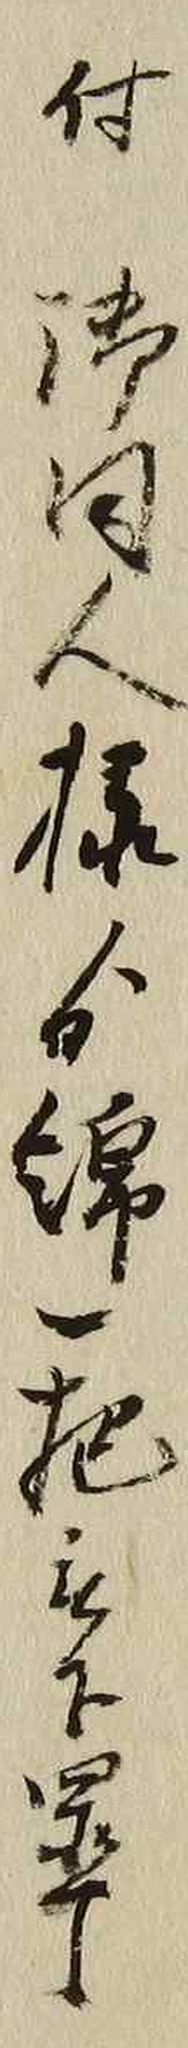付御同人様ゟ綿一把被下置候
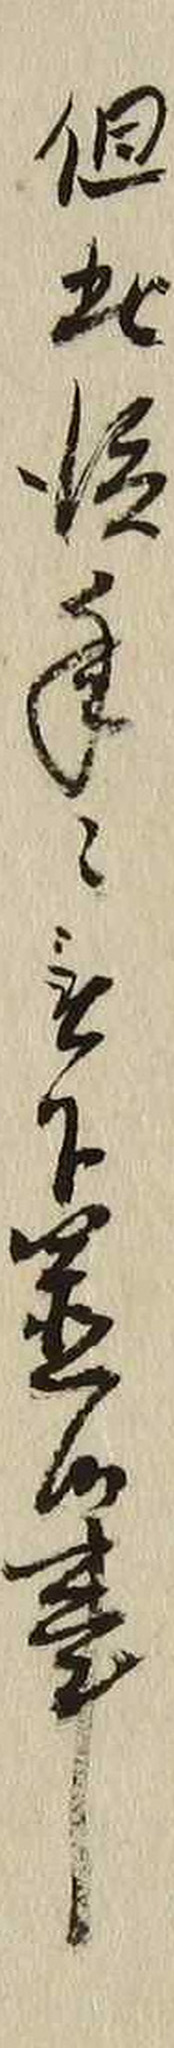但此後年々被下置候事
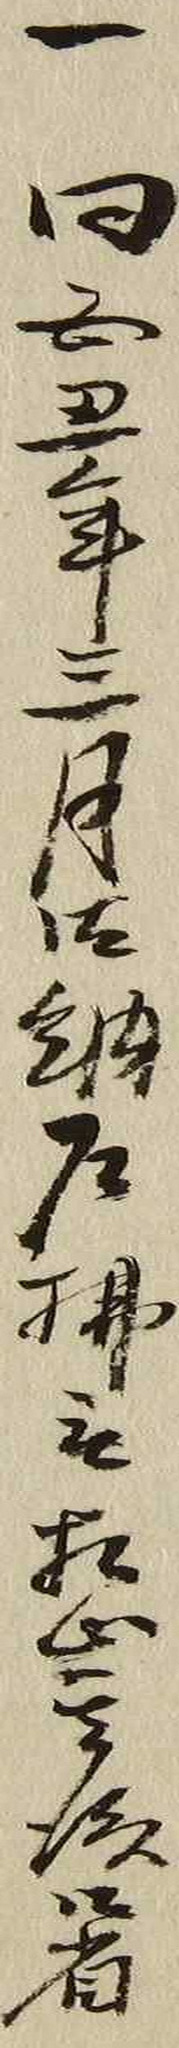一同五丑年三月御納戸払被相止其後御省
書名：諸士系譜　巻之345　も之部1
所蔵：会津若松市立会津図書館
